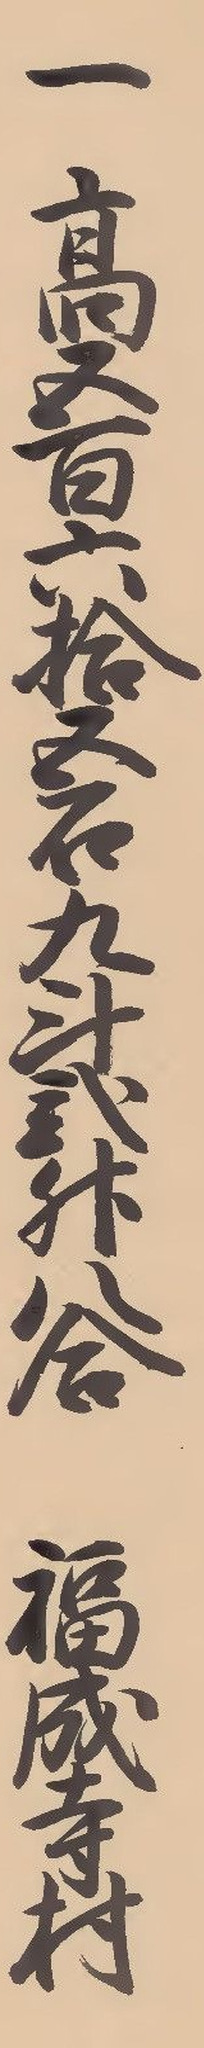一高五百六拾五石九斗弐升八合福成寺村
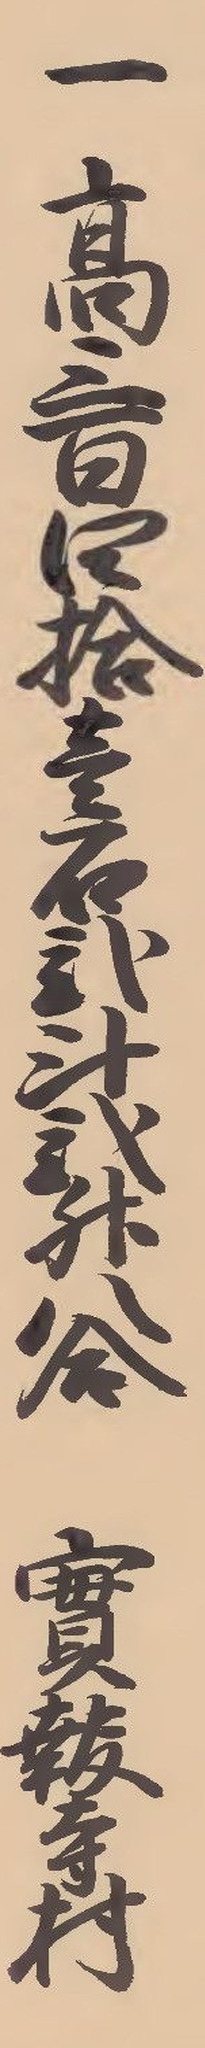一高三百四拾壱石弐斗弐升八合実報寺村
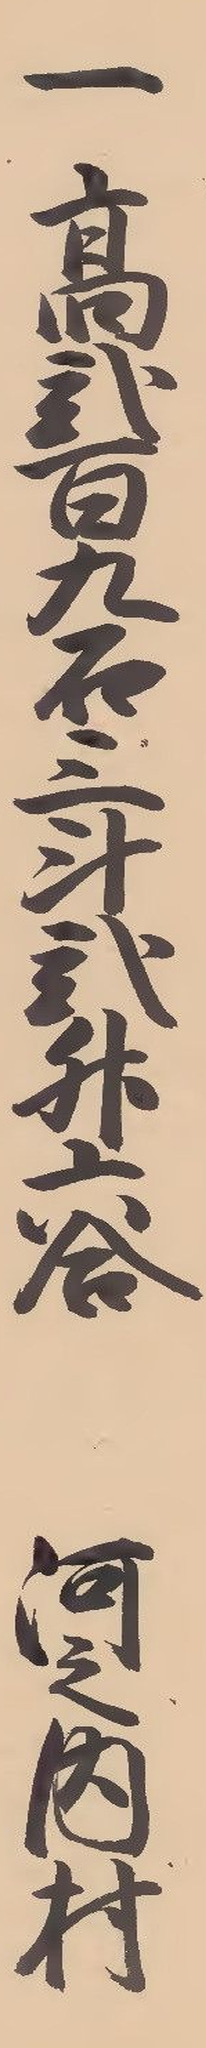一高弐百九石三斗弐升六合河之内村
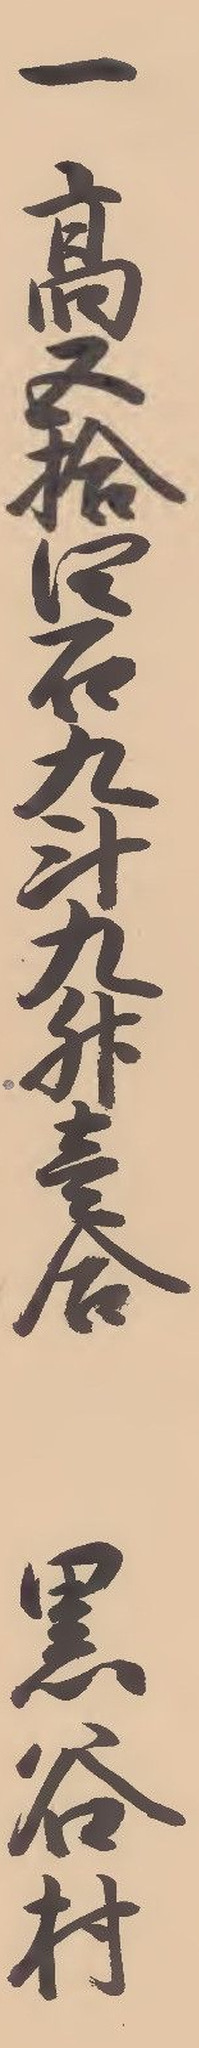一高五拾四石九斗九升壱合黒谷村

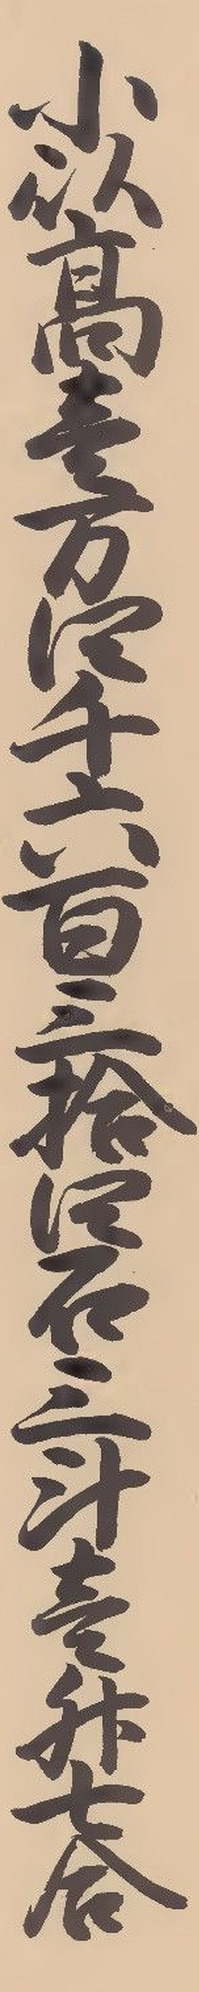小以高壱万四千六百三拾四石三斗壱升七合
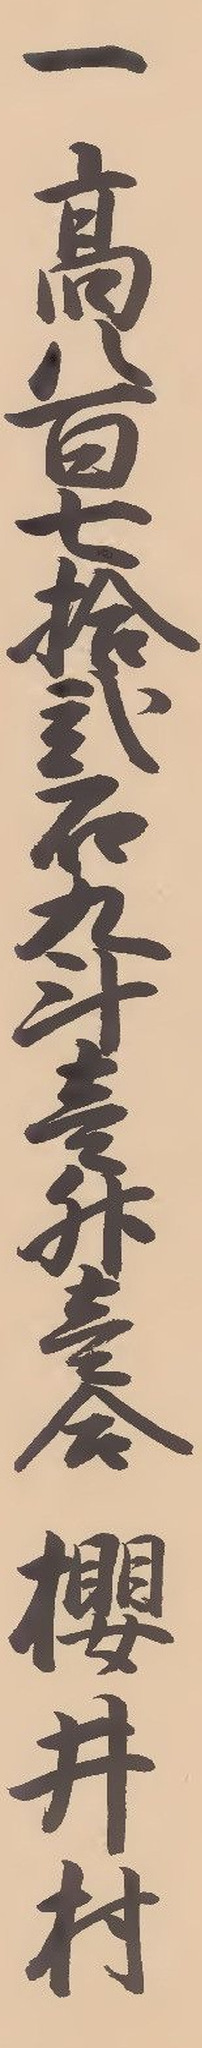一高八百七拾弐石九斗壱升壱合桜井村
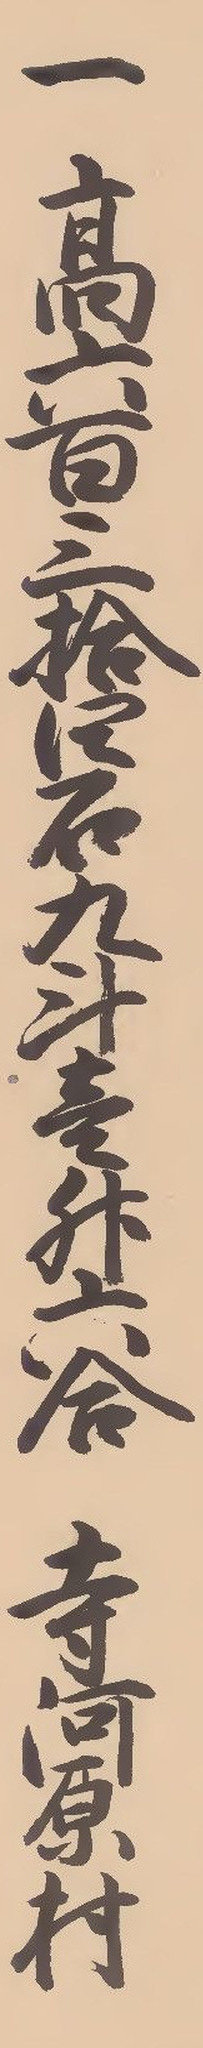一高六百三拾四石九斗壱升六合寺河原村

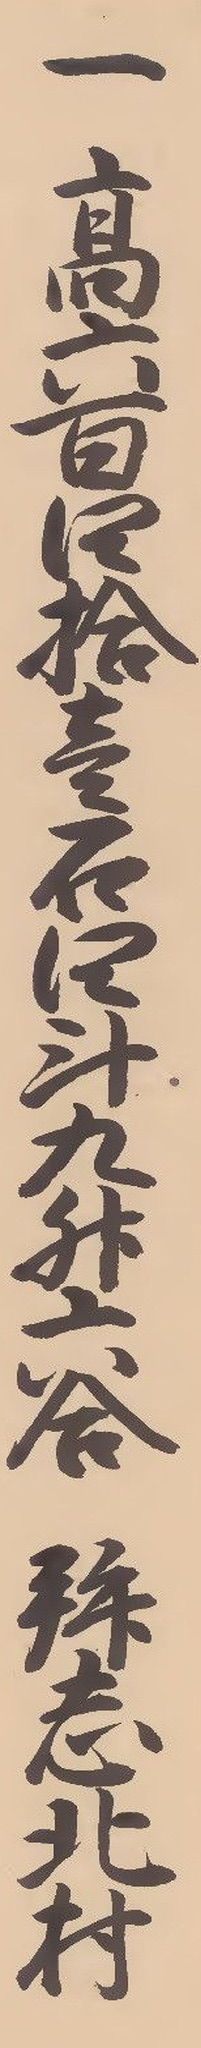一高六百四拾壱石四斗九升六合拝志北村
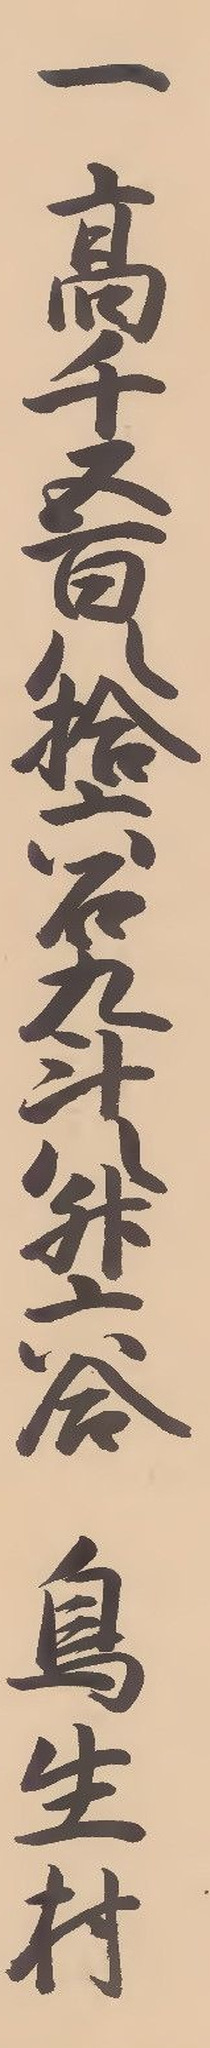一高千五百八拾六石九斗八升六合鳥生村
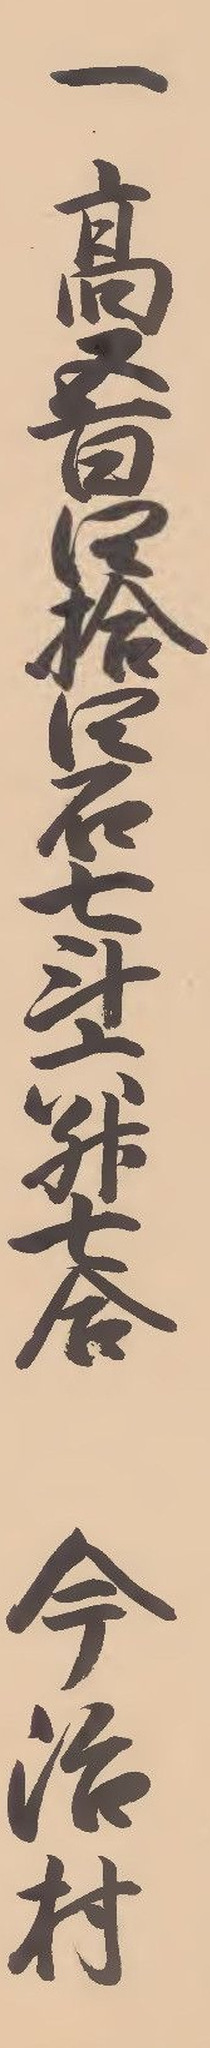一高五百四拾四石七斗六升七合今治村
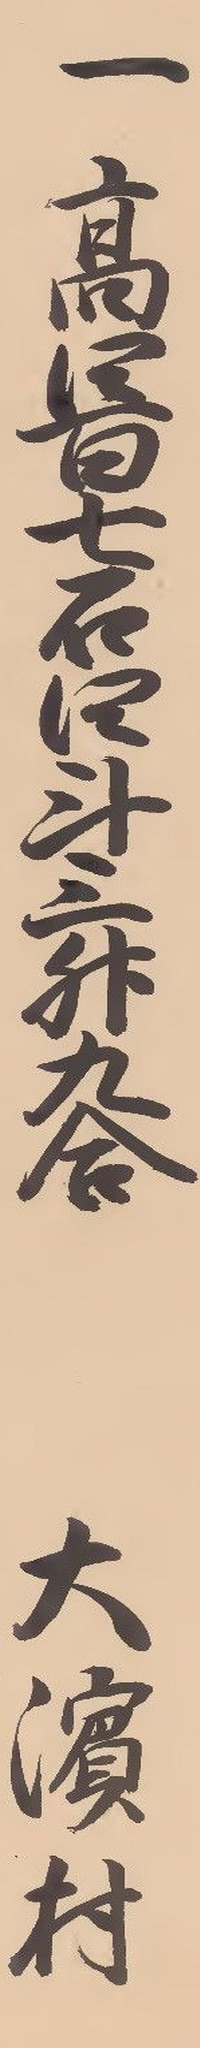一高四百七石四斗三升九合大浜村
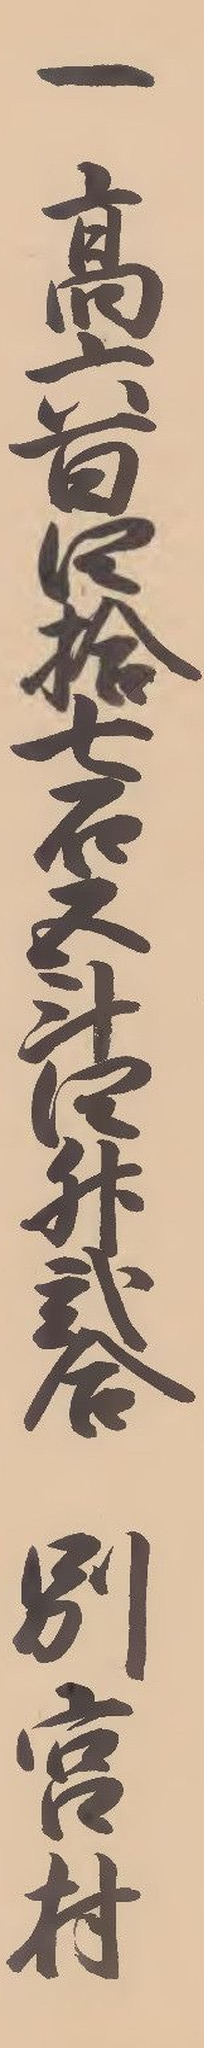一高六百四拾七石五斗四升弐合別宮村
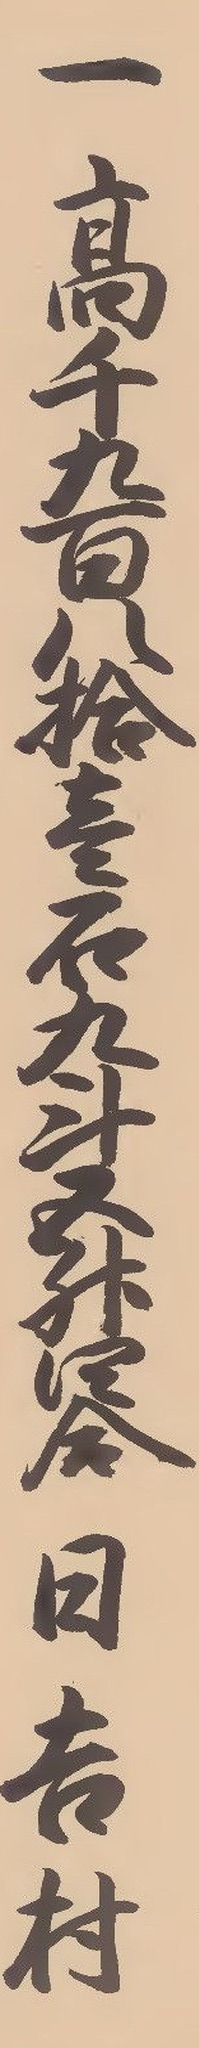一高千九百八拾壱石九斗五升四合日吉村
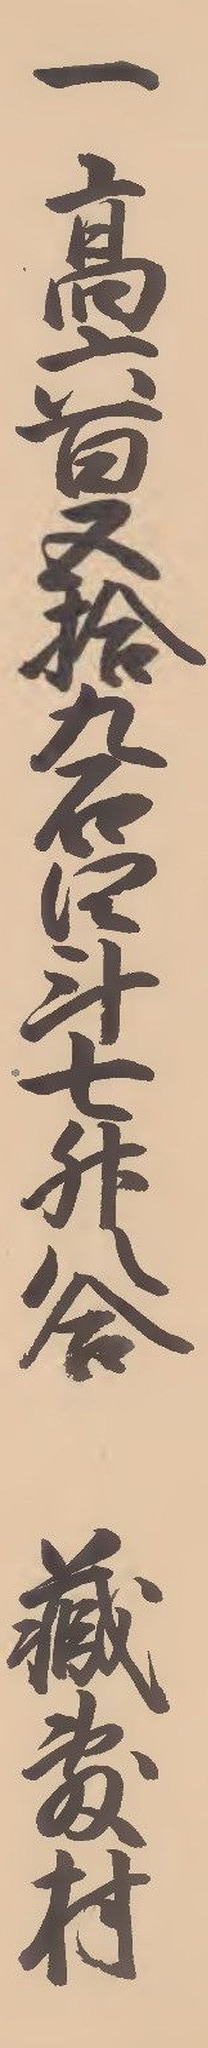一高六百五拾九石四斗七升八合蔵敷村

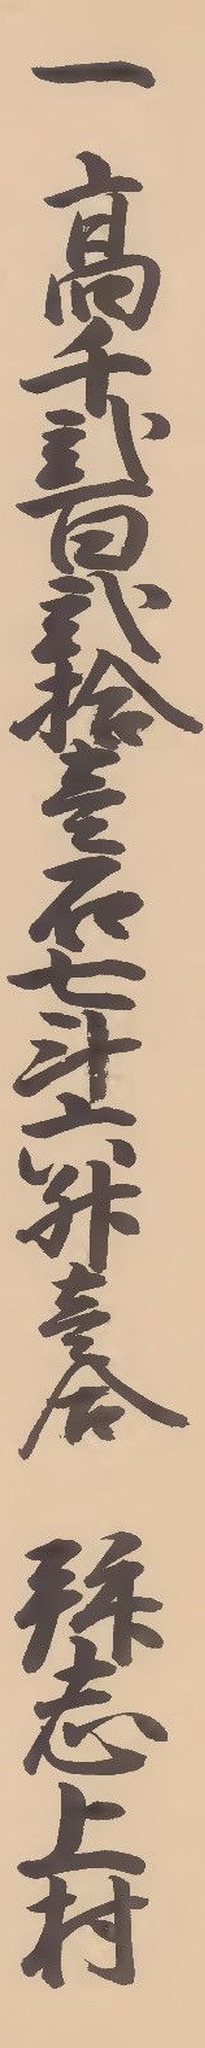一高千弐百弐拾壱石七斗六升壱合拝志上村
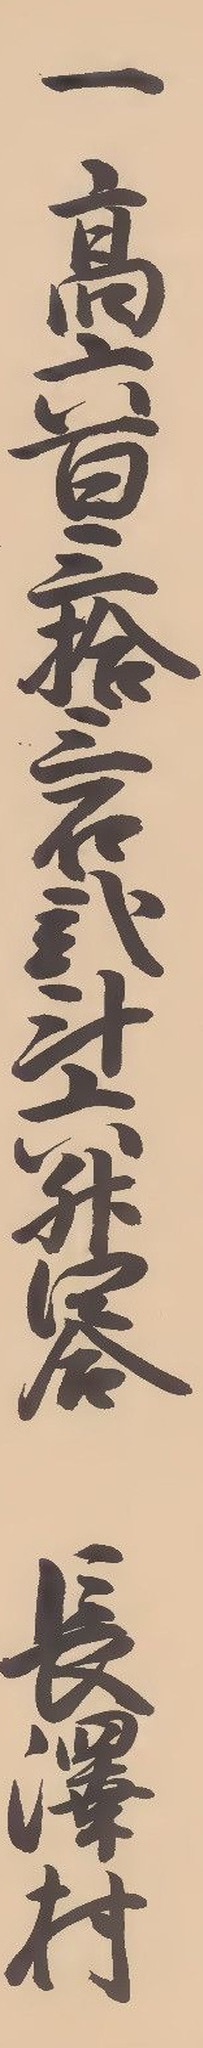一高六百三拾三石弐斗六升四合長沢村
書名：伊予国郷帳
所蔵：国立公文書館 National Archives of Japan
